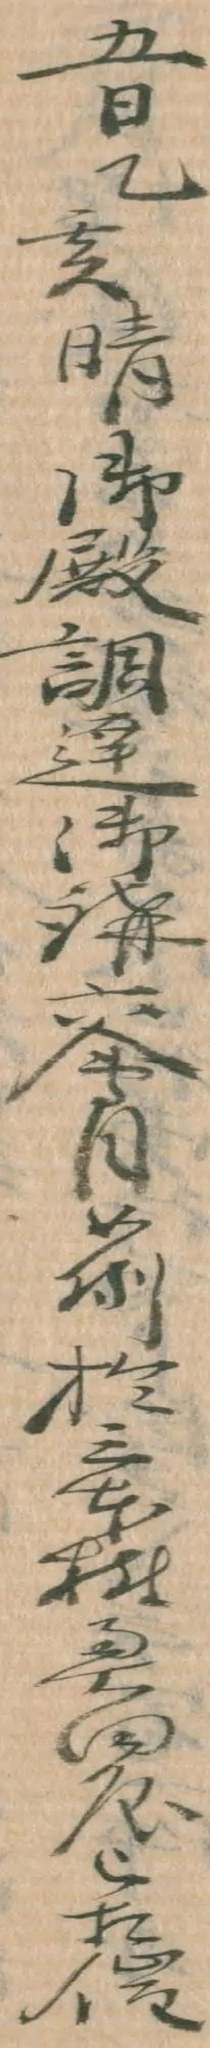五日乙亥晴御殿調達御講六會目如例於三本柎奥田屋被相催
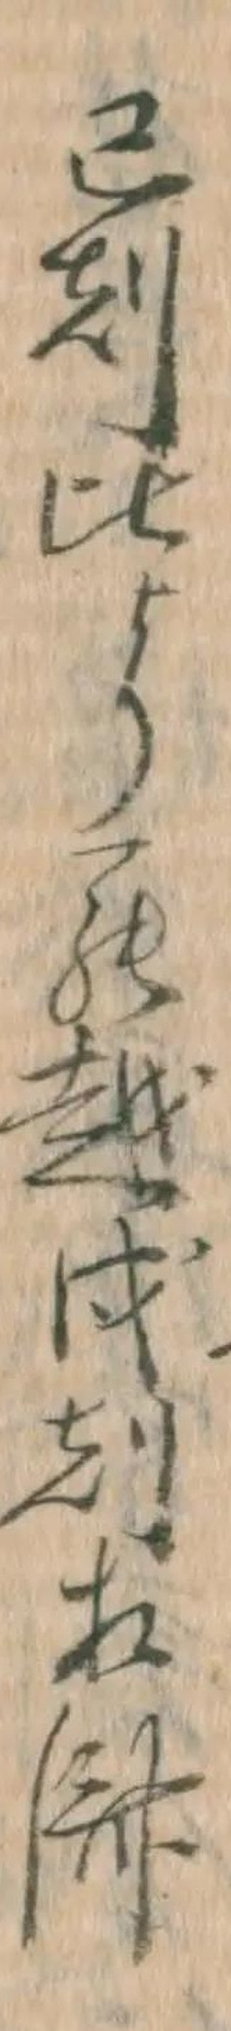巳刻比より罷越戌刻相済
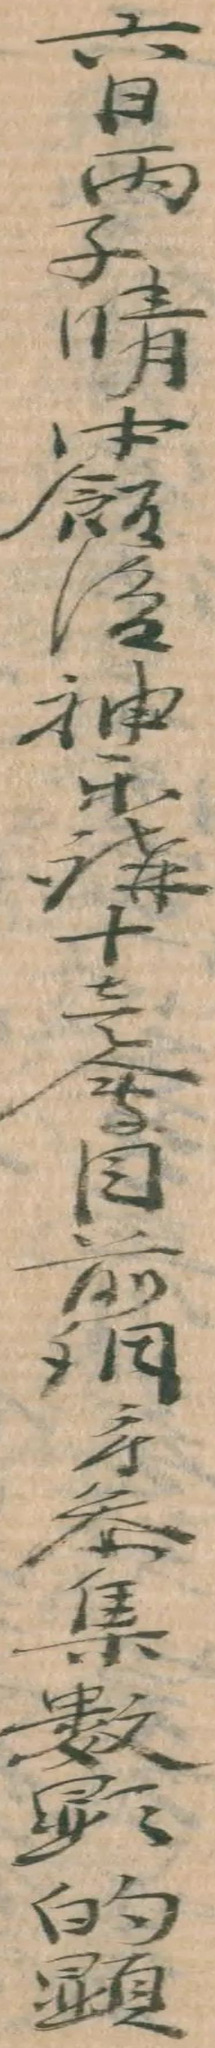六日丙子晴中飯後神楽講十壱會目前調ニ付参集數顕的顕
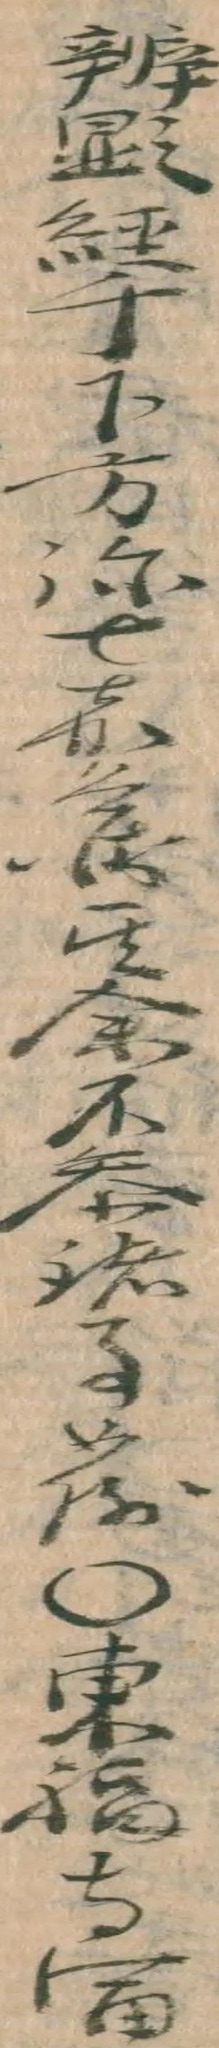辨顕経千下方弥七嘉蔵其余不参諸事如例○東福寺冨
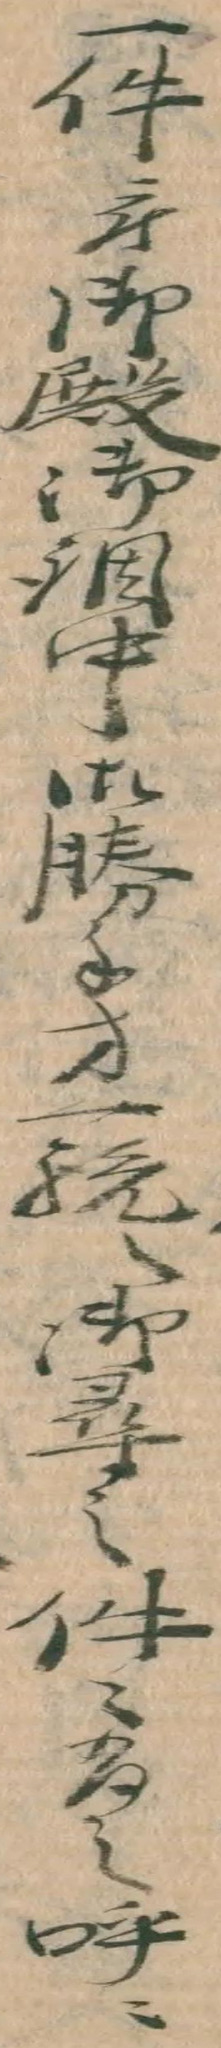一件ニ付御殿御調中御勝手方一統へ御尋之件々有之呼ニ
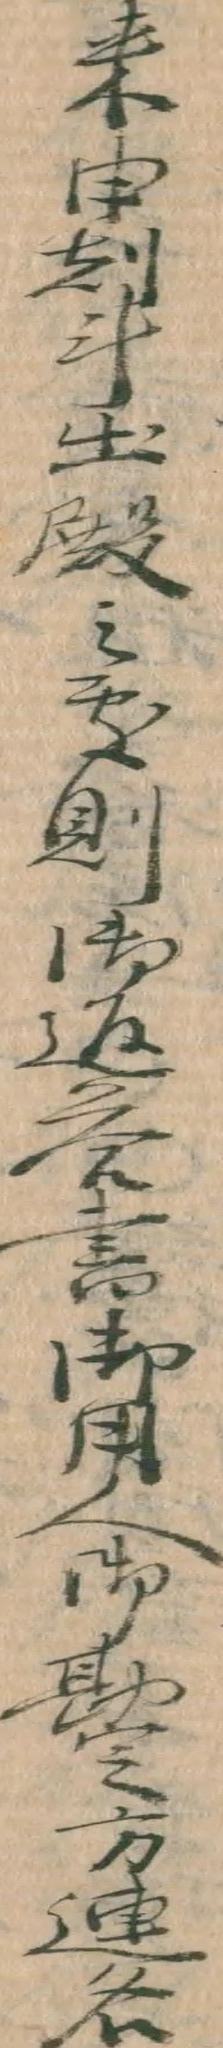来申刻斗出殿之處則御返答書御用人御勘定方連名
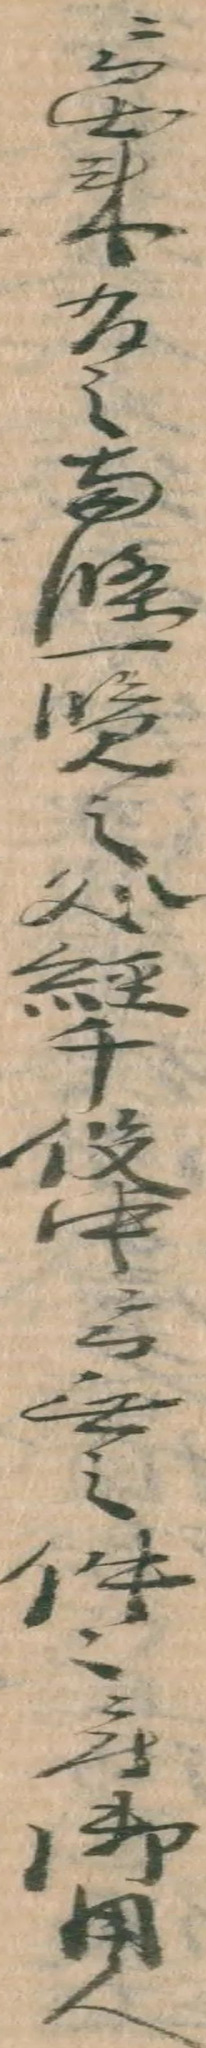ニ而出来有之両條一覧之処経千役中ニ而無之件々ニ付御用人
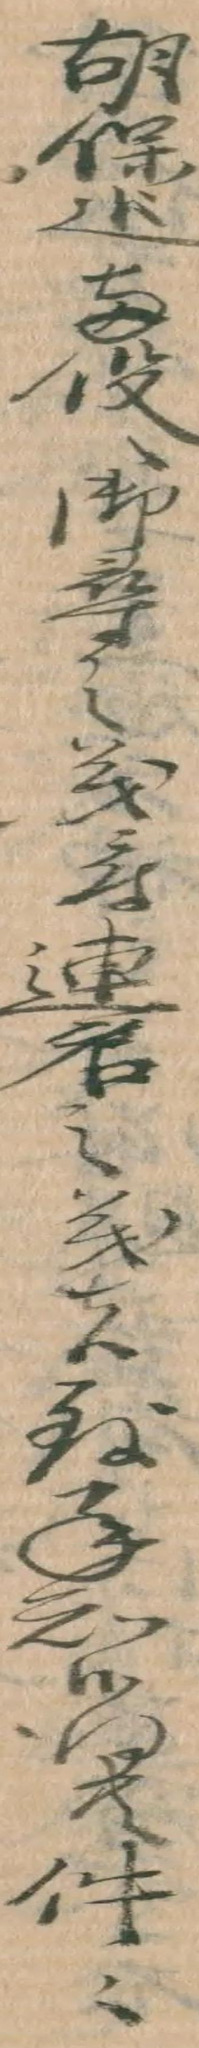胡保迄両役へ御尋之義ニ付連名之義は致承知候得共件々
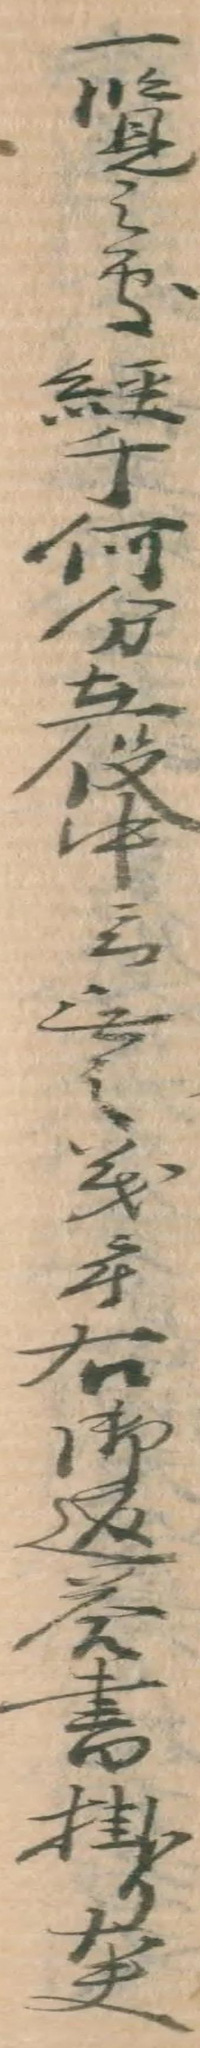一覧之處経千何分在役中ニ而無之義ニ付右御返答書掛り大夫
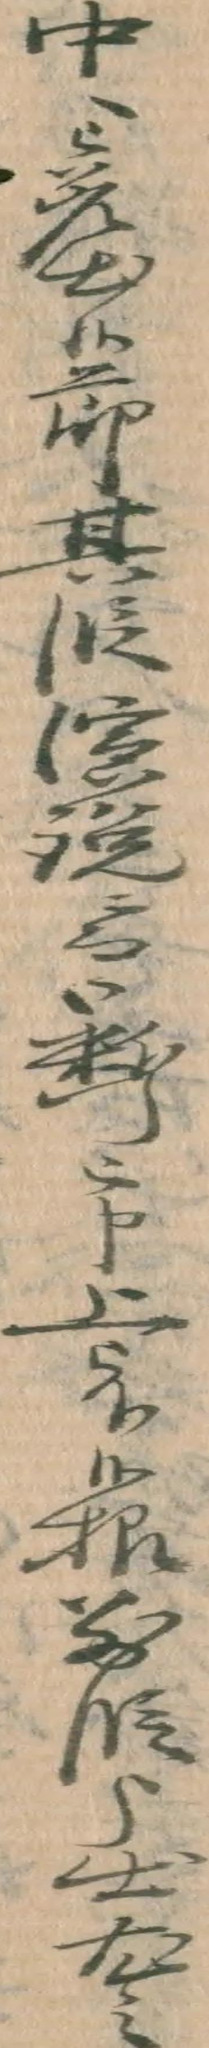中へ被差出候節其段演説ニ而御断被申上被下候様別段申出尤之
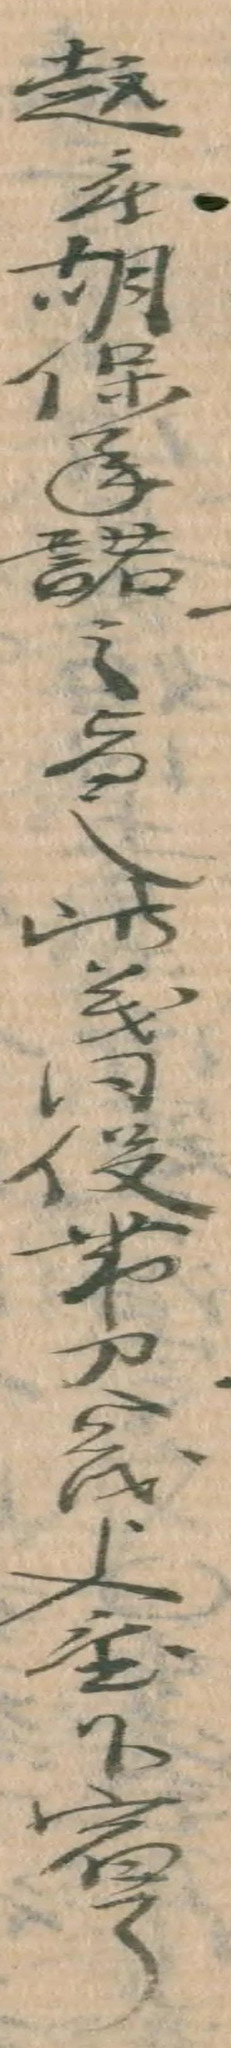趣ニ付胡保承諾之旨也此義同役帯刀へも申入置下宿了
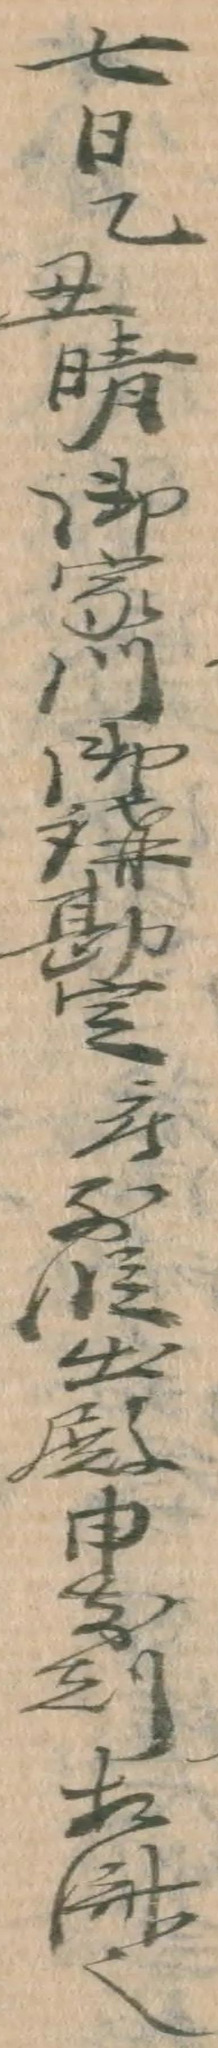七日乙丑晴御家門御講勘定ニ付別段出殿申前刻相済也
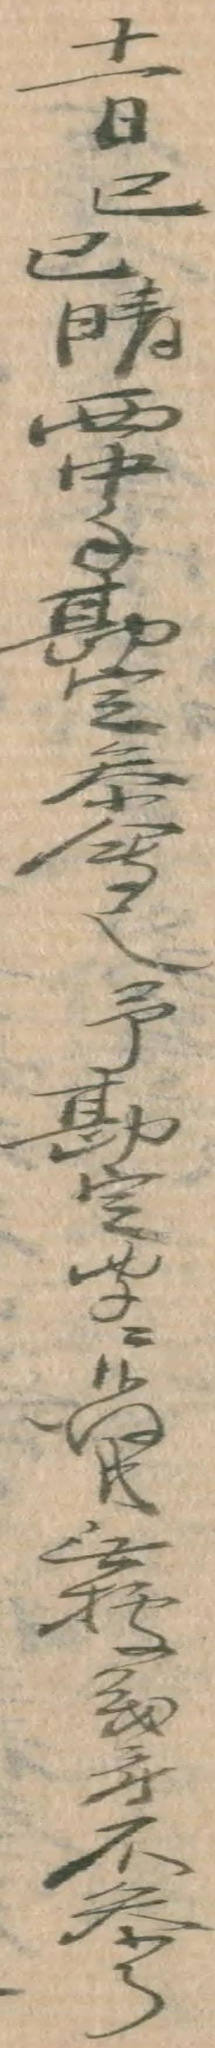十一日己巳晴西中手勘定参會也予勘定聞ニ候得共無拠義ニ付不参了
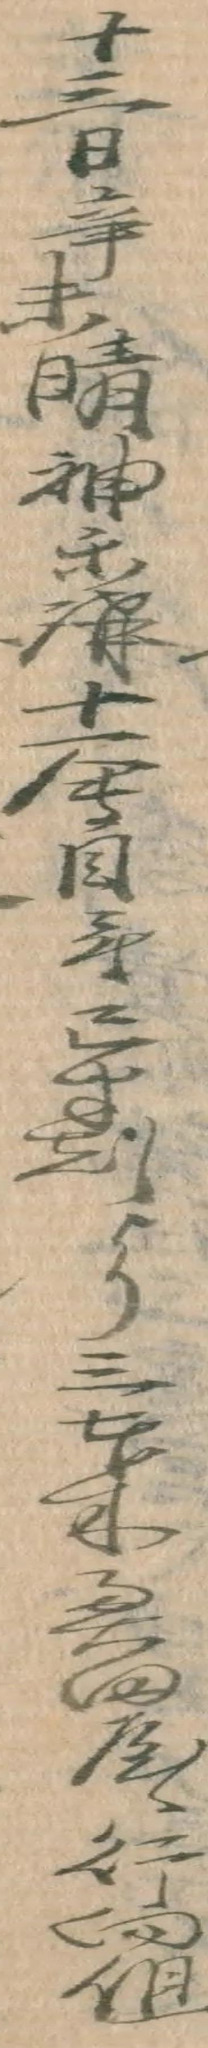十三日辛未晴神楽講十一會目ニ付巳半刻より三本木奥田屋へ行向但
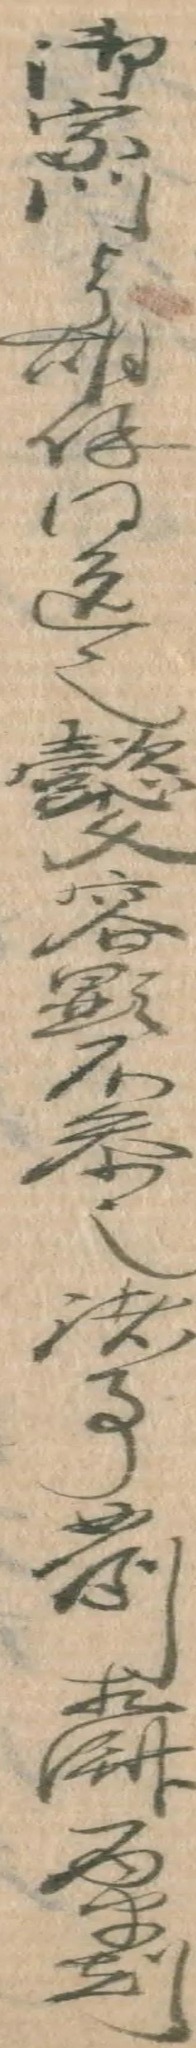御家門より胡保同道也懿久容顕不参之諸事如前相済酉半刻
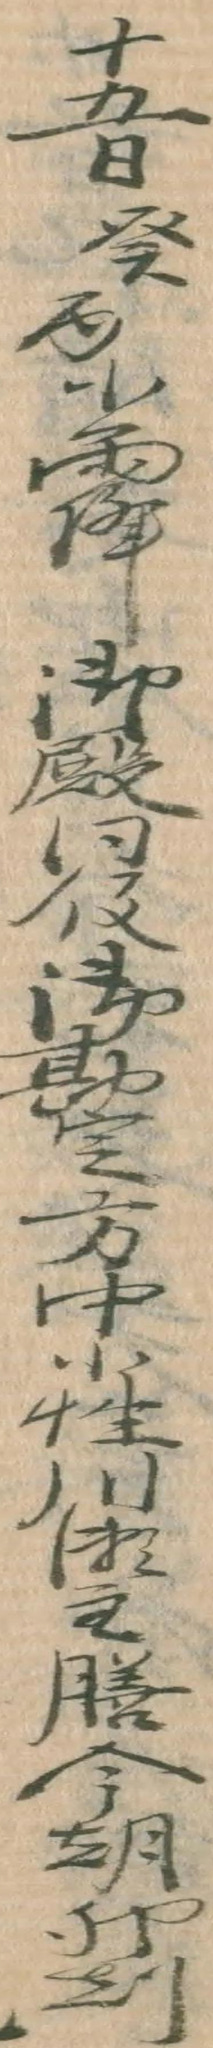十五日癸酉小雨降御殿同役御勘定方中小性川瀬主膳今朝卯刻
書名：賀茂社記録. 第65冊
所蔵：国立国会図書館 National Diet Library, JAPAN
